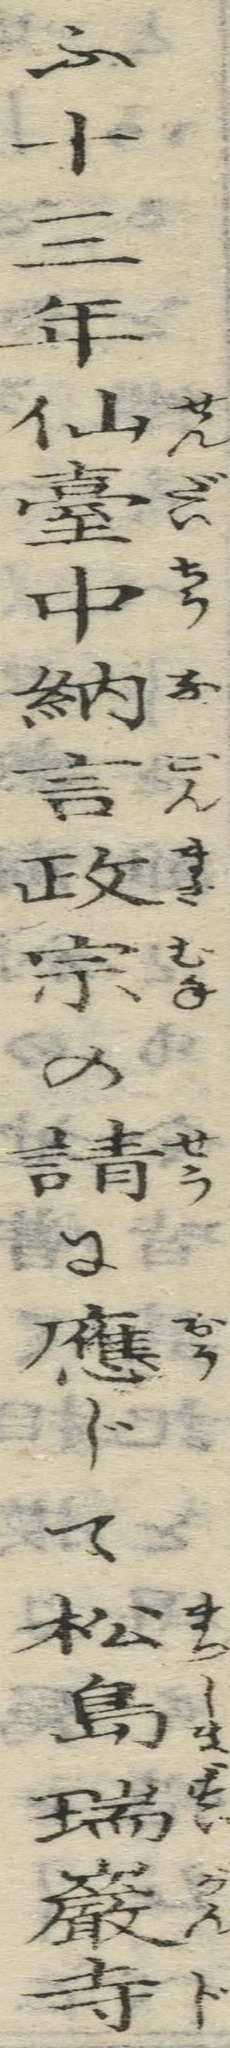ふ十三年仙台中納言政宗の請に応じて松島瑞巌寺
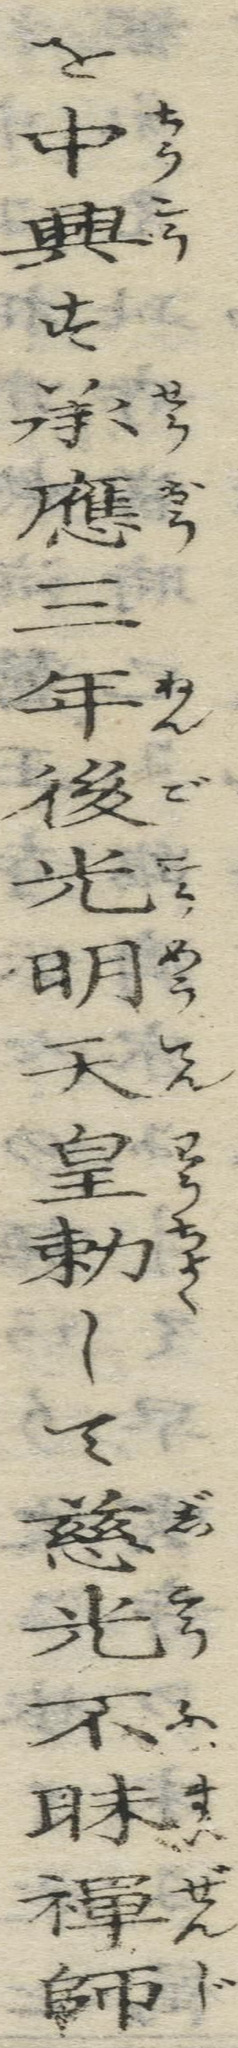を中興す承応三年後光明天皇勅して慈光不昧禅師
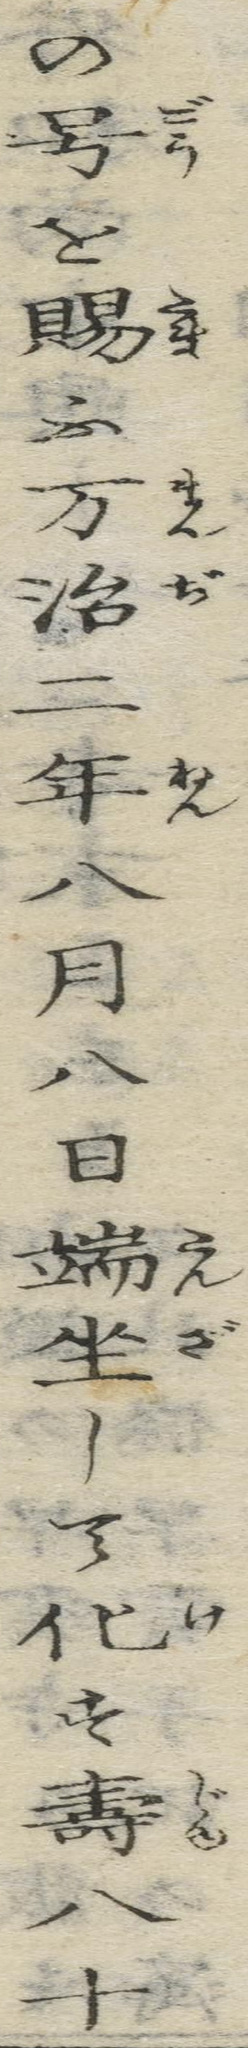の号を賜ふ万治二年八月八日端坐して化す寿八十
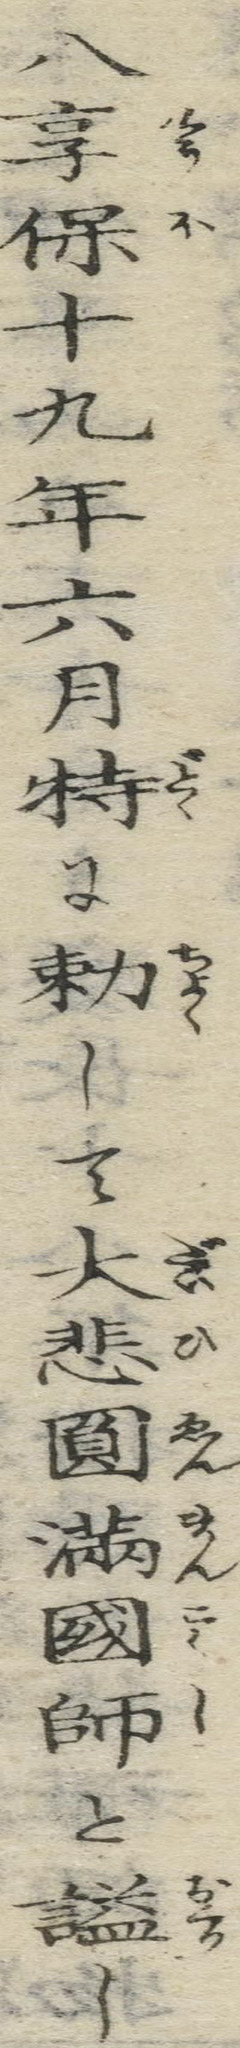八享保十九年六月特に勅して大悲圓満国師と謚し
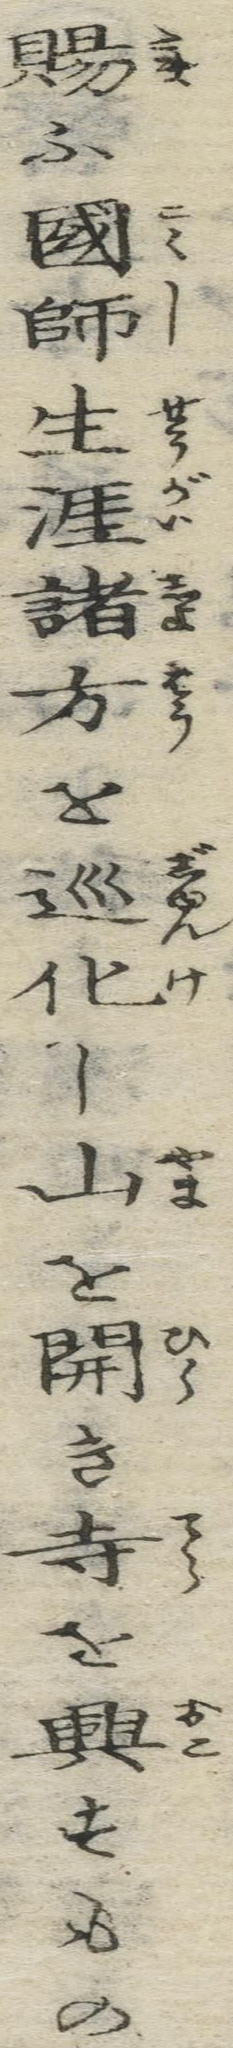賜ふ国師生涯諸方を巡化し山を開き寺を興すもの
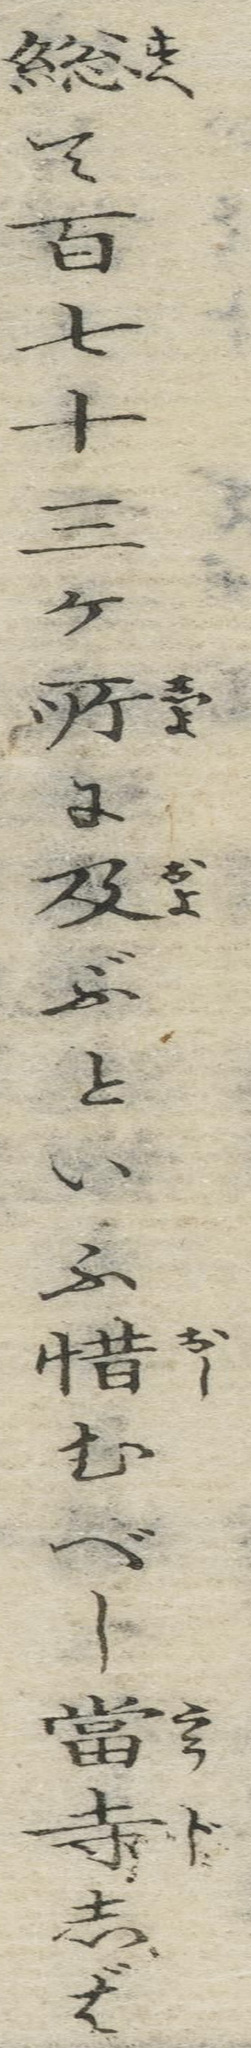総て百七十三ヶ所に及ぶといふ惜むべし当寺しば
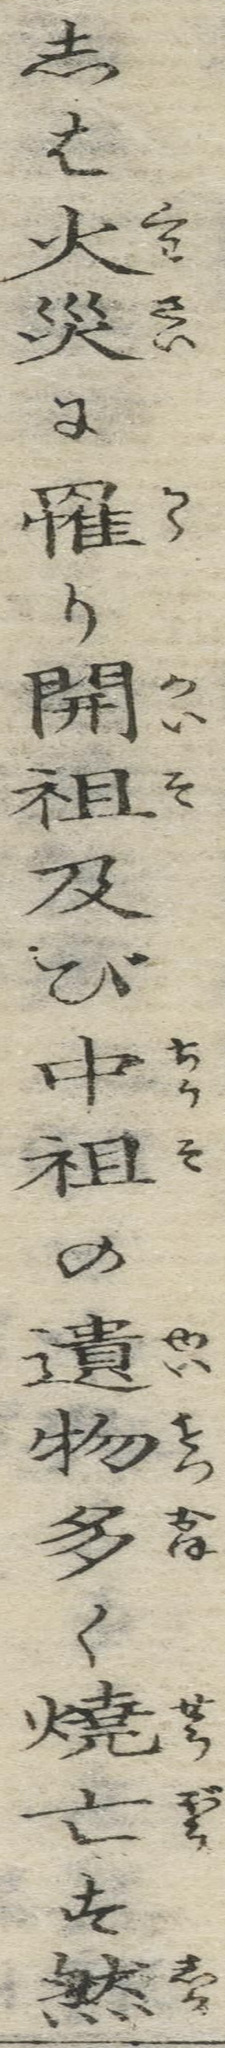しは火災に罹り開祖及び中祖の遺物多く焼亡す然
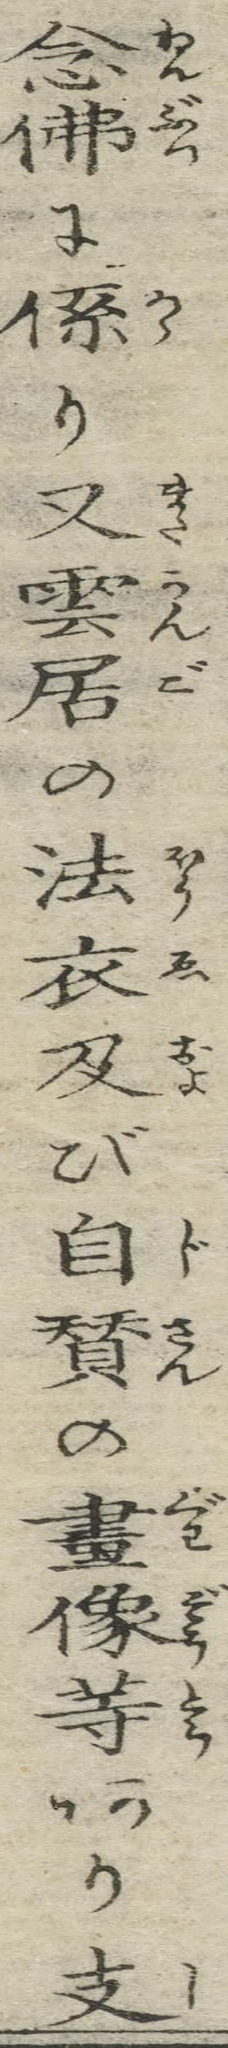念仏に係り又雲居の法衣及び自賛の画像等あり支

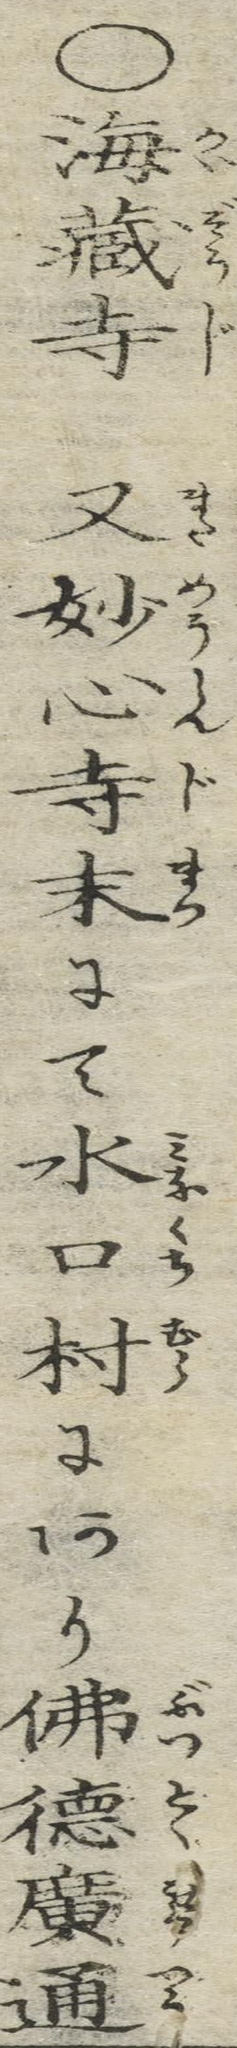○海蔵寺又妙心寺末にて水口村にあり佛徳広通
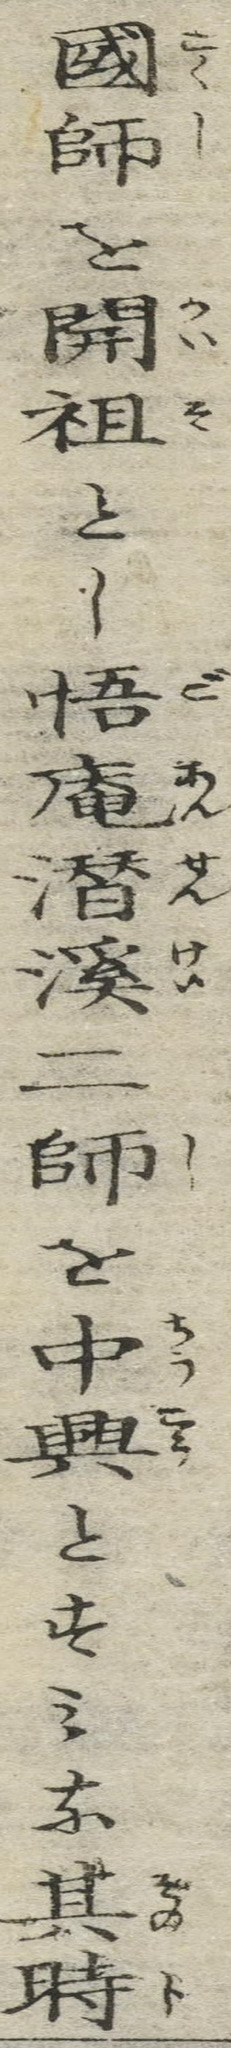国師を開祖とし悟庵潜溪二師を中興とすみな其時
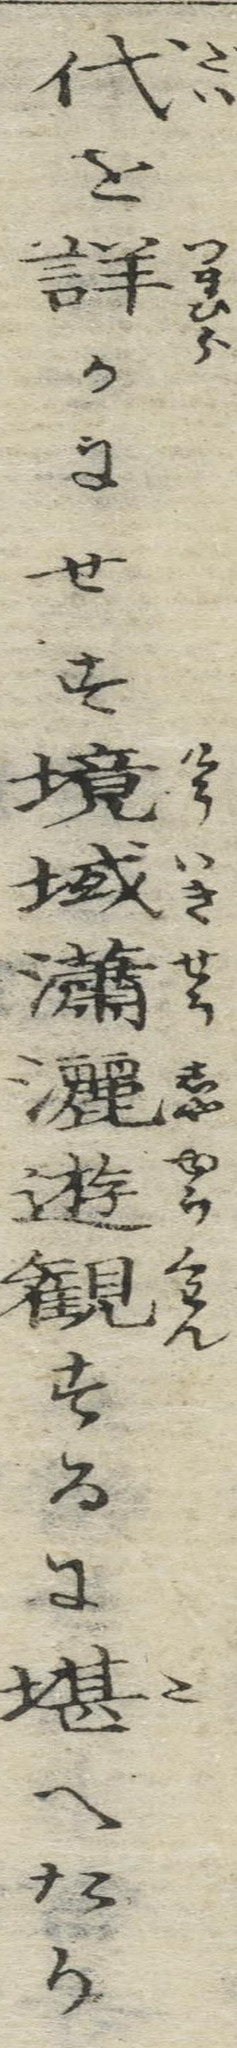代を詳かにせず境域潚灑遊観するに堪へたり
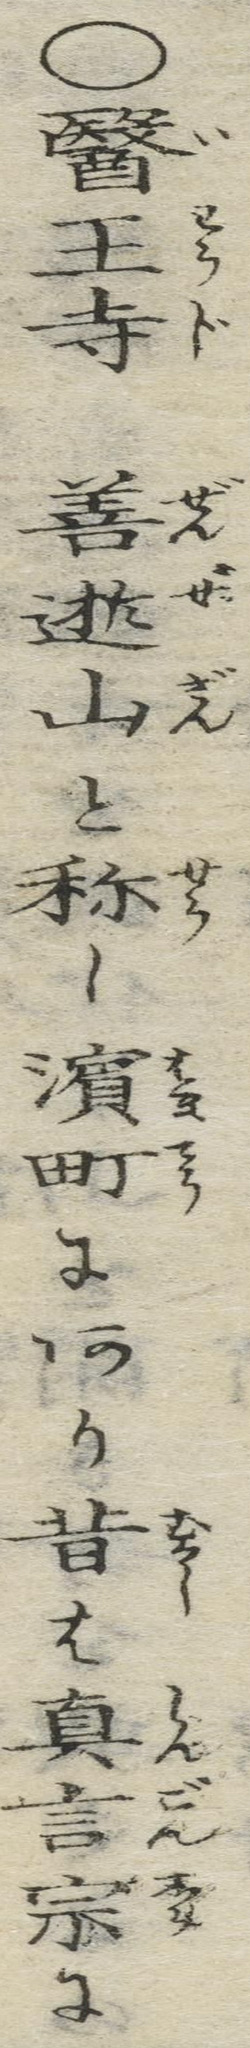○医王寺善逝山と称し浜町にあり昔は真言宗に
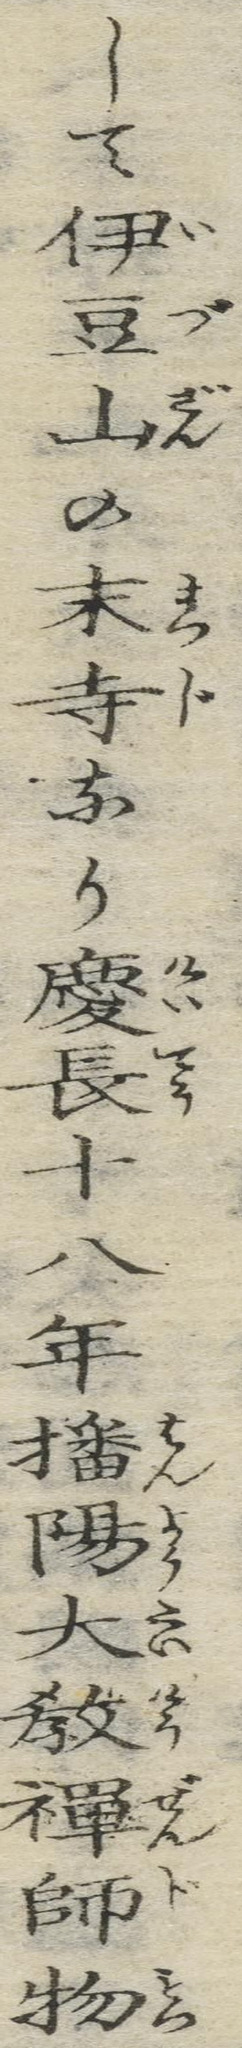して伊豆山の末寺なり慶長十八年播陽大教禅師物
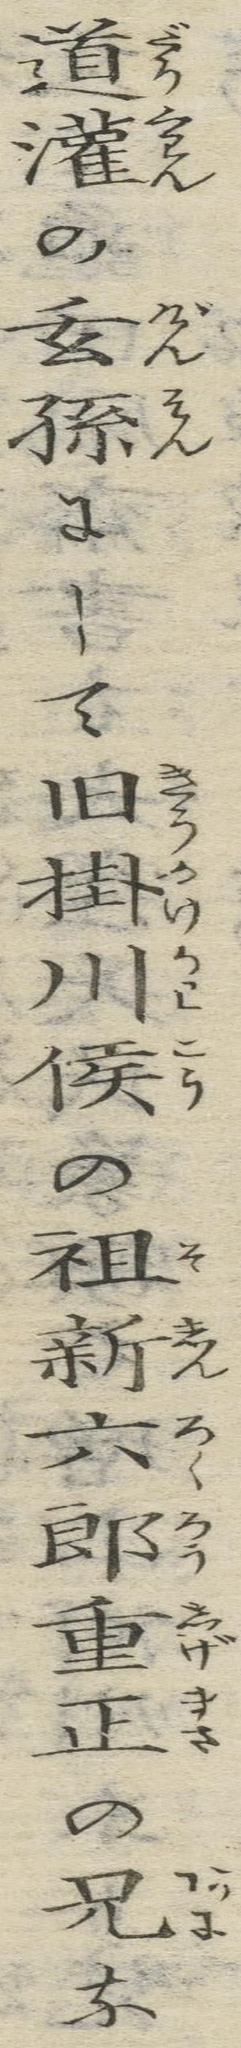道灌の玄孫にして旧掛川侯の祖新六郎重正の兄な
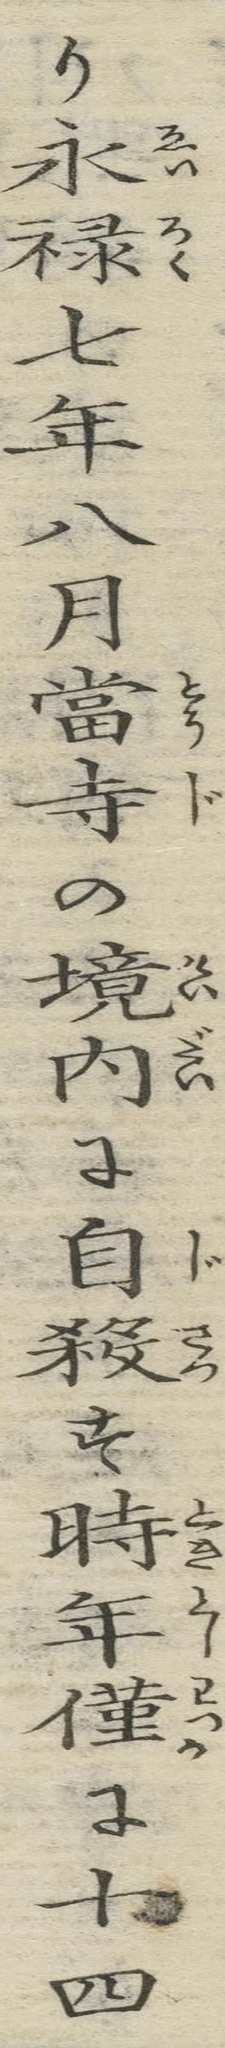り永禄七年八月当寺の境内に自殺す時年僅に十四
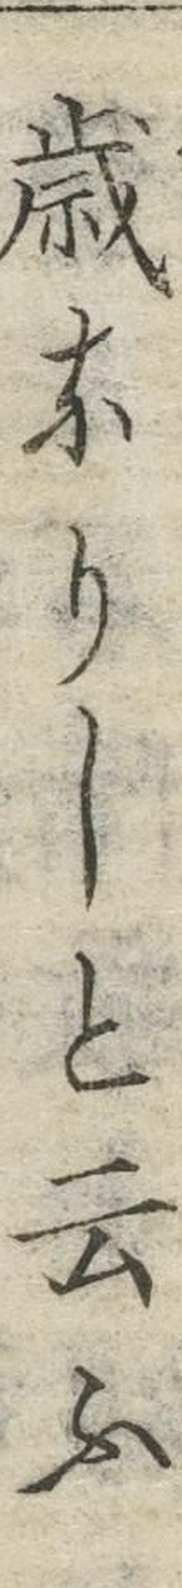歳なりと云ふ
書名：豆州熱海誌　完
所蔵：東京大学地震研究所図書室 Earthquake Research Institute Library, The University of Tokyo, JAPAN
